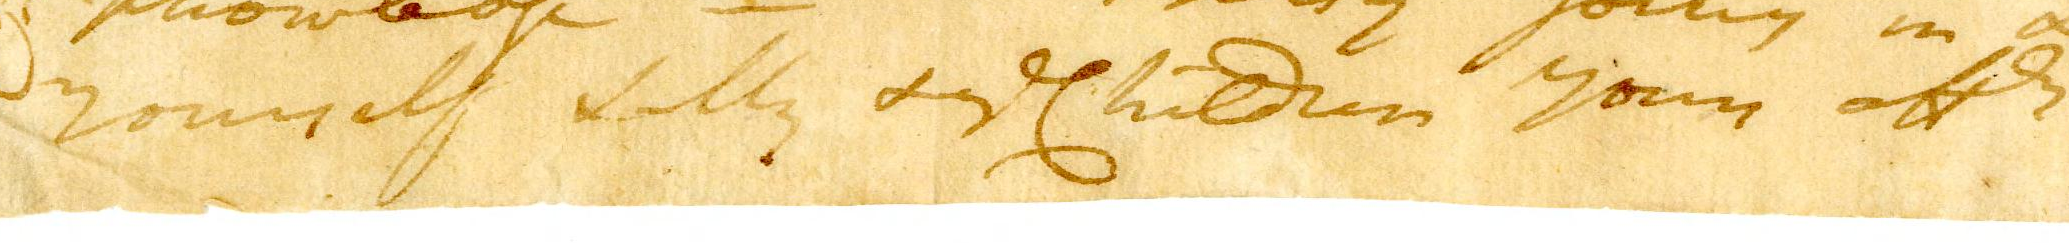yourself Sally & y^e Children your aff^t.
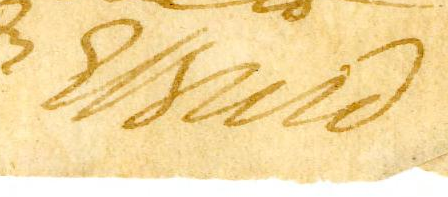E Burd
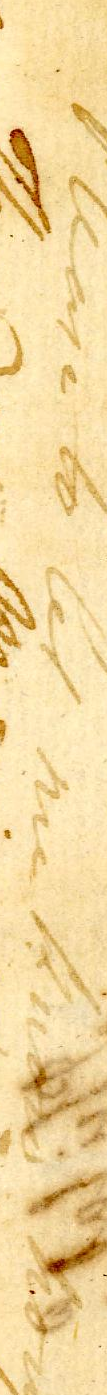Please to let me know how
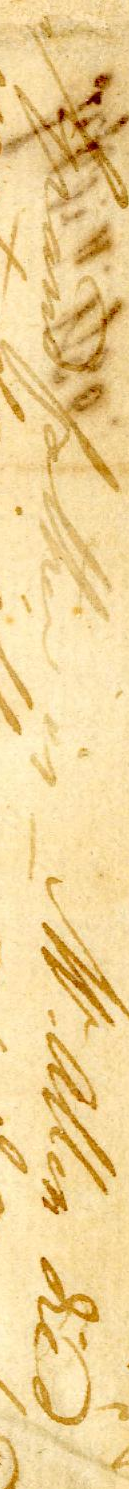Grandfather is. M^r. Allen died
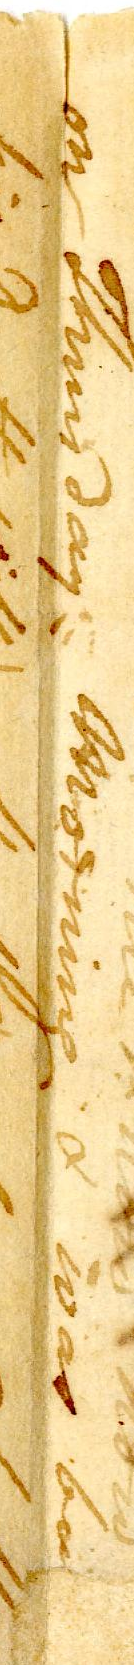on Thursday morning I was bu
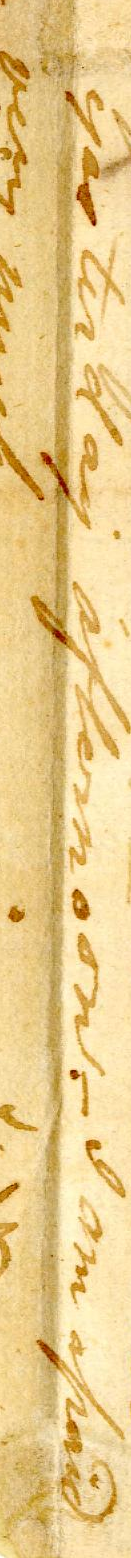yesterday afternoon. I am afraid
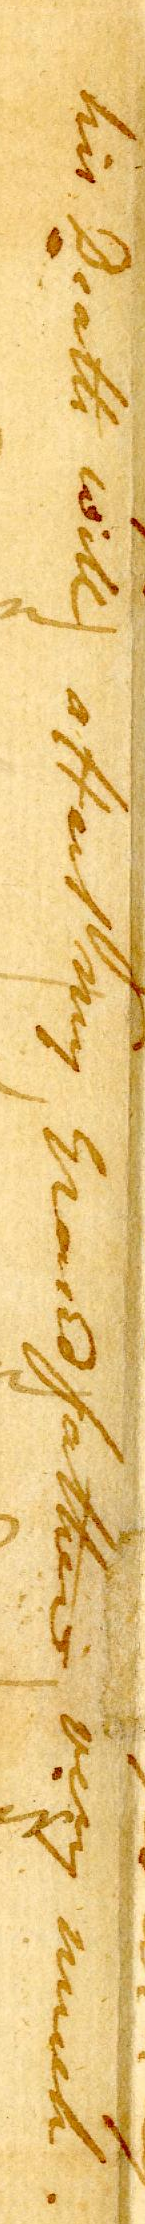his Death will affect my Grandfather very much
